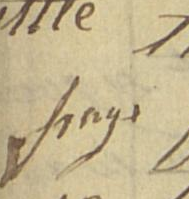pays
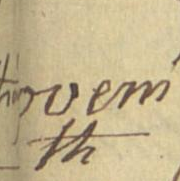-ovem^r
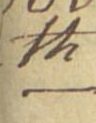th
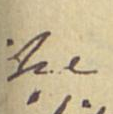be
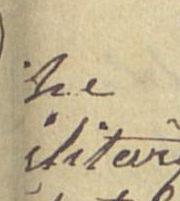-ilitary
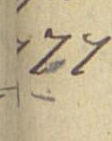-77
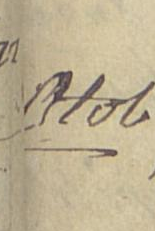Octob^r
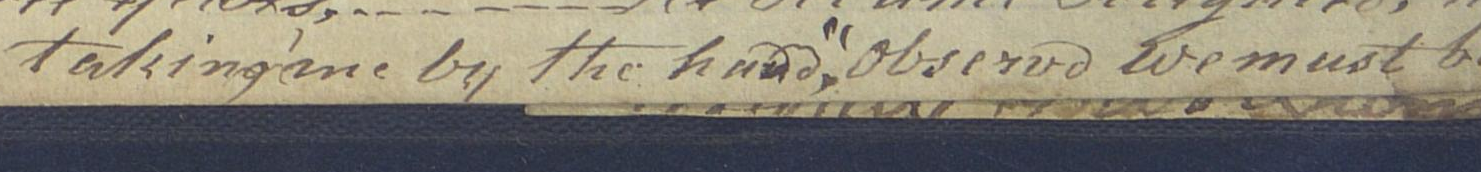taking me by the hand," observd we must be
